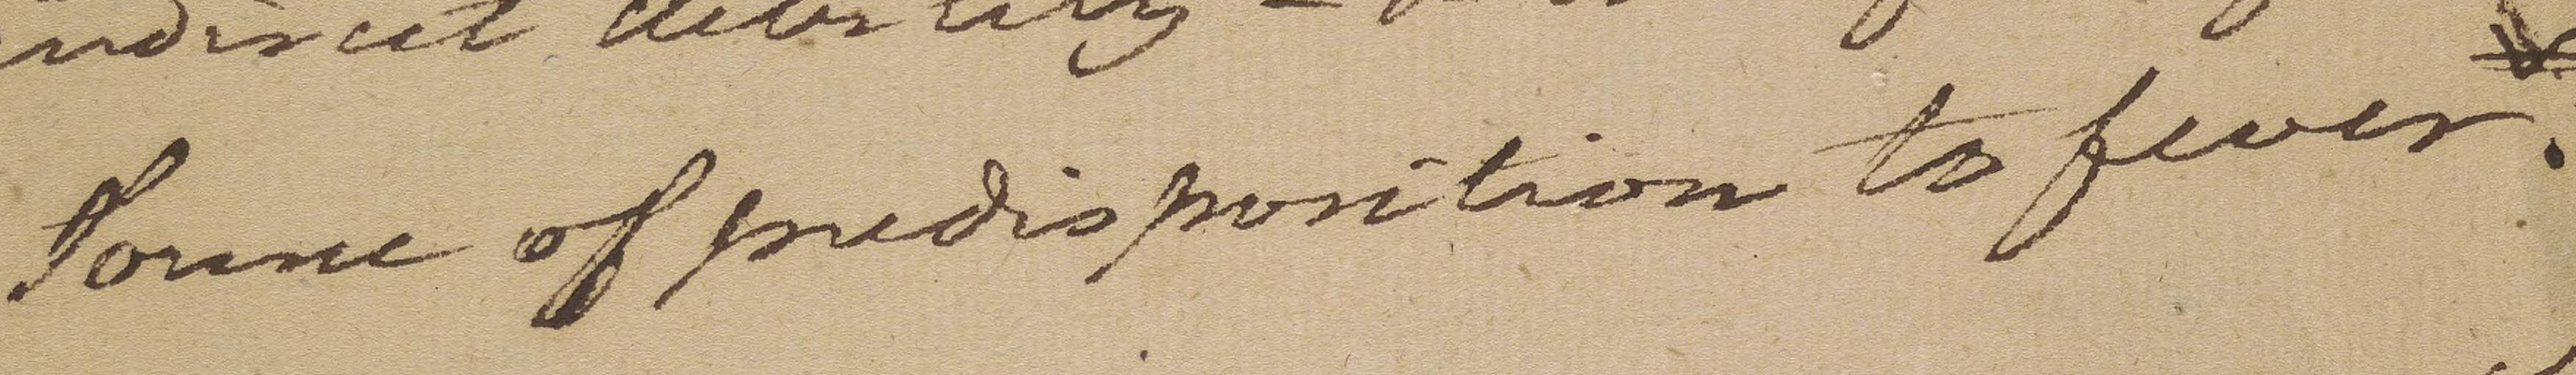source of predisposition to fever.
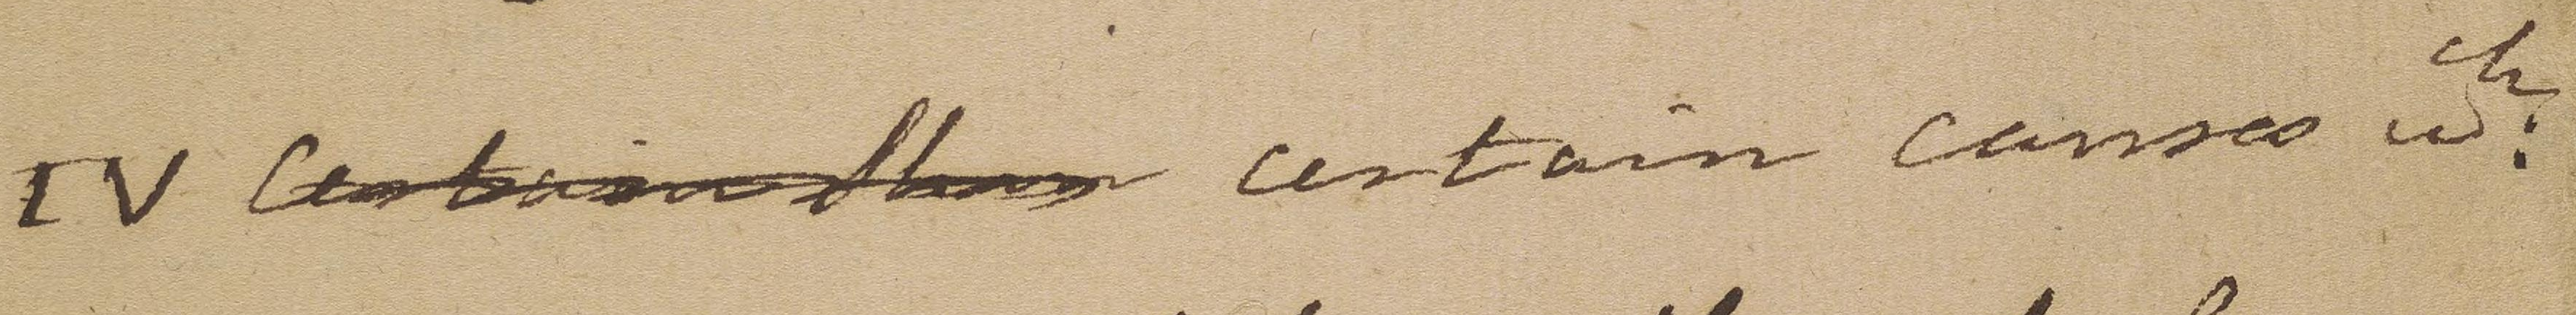IV [Certain Sh__] certain causes w^ch:
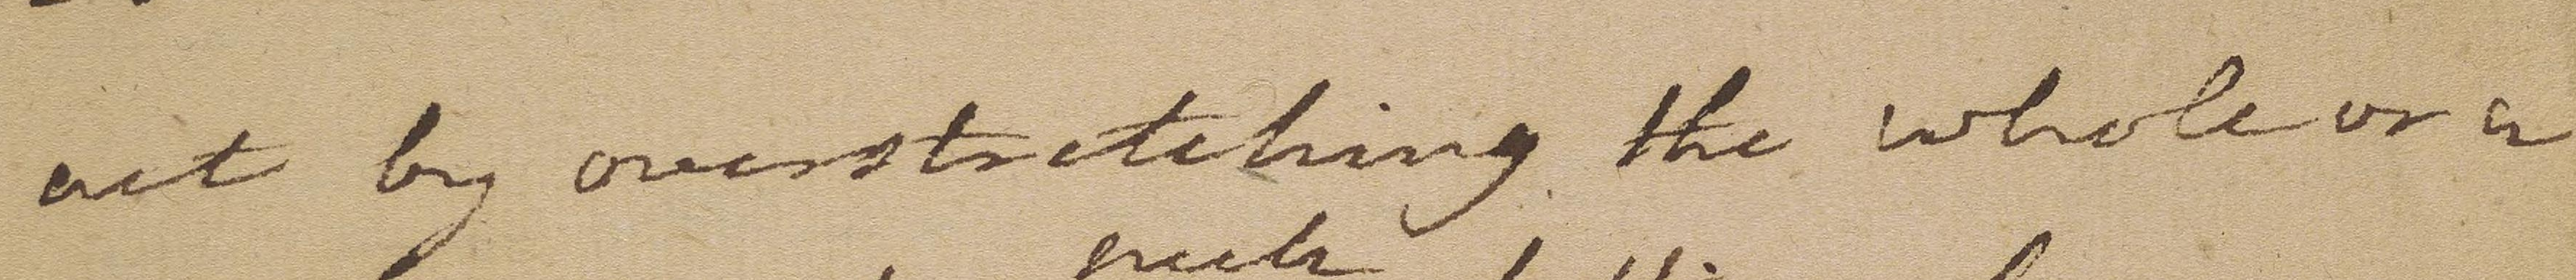act by overstretching the whole or a
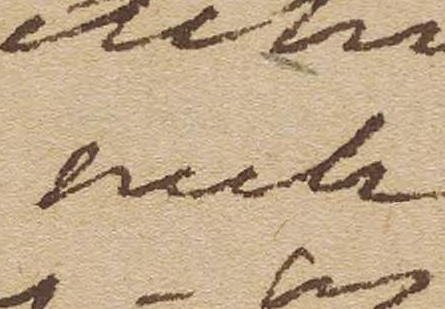much
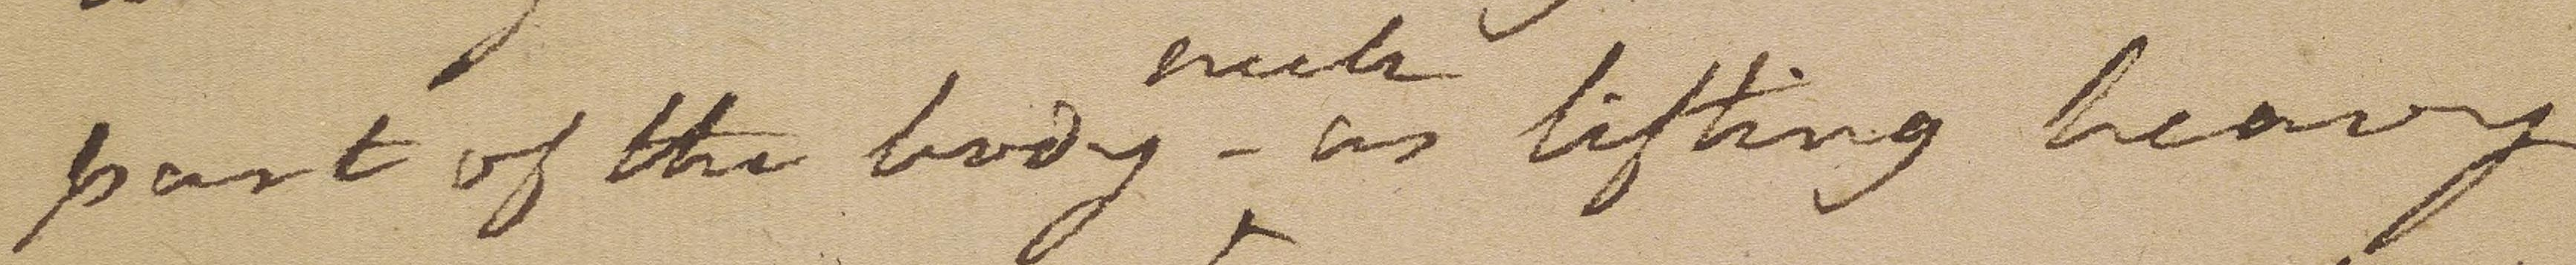part of the body ^ as lifting heavy
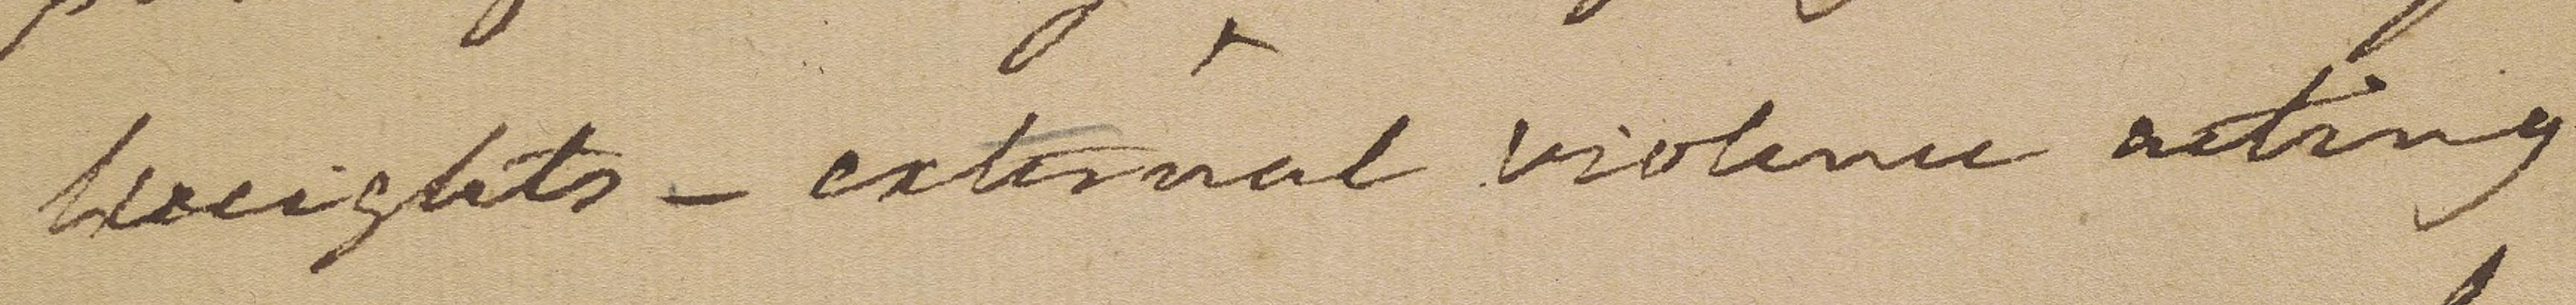weights, external violence acting
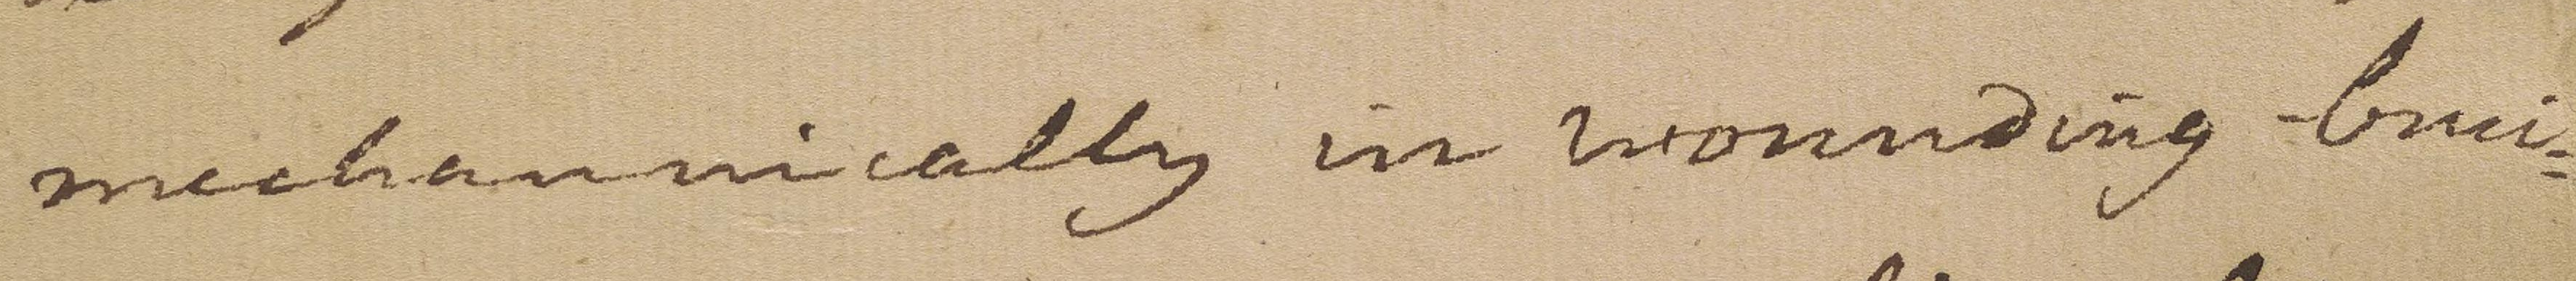much anemically in wounding, brui-
